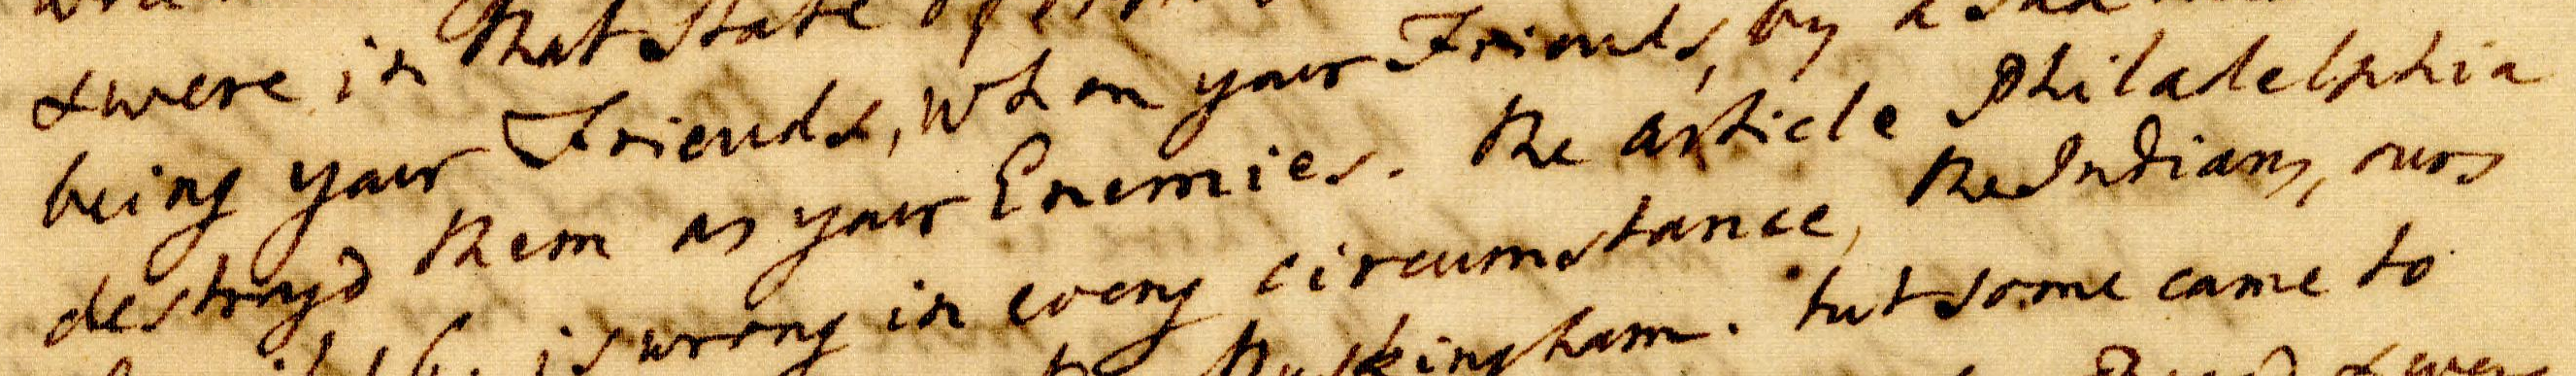destroy'd them as your Enemies. the article Philadelphia
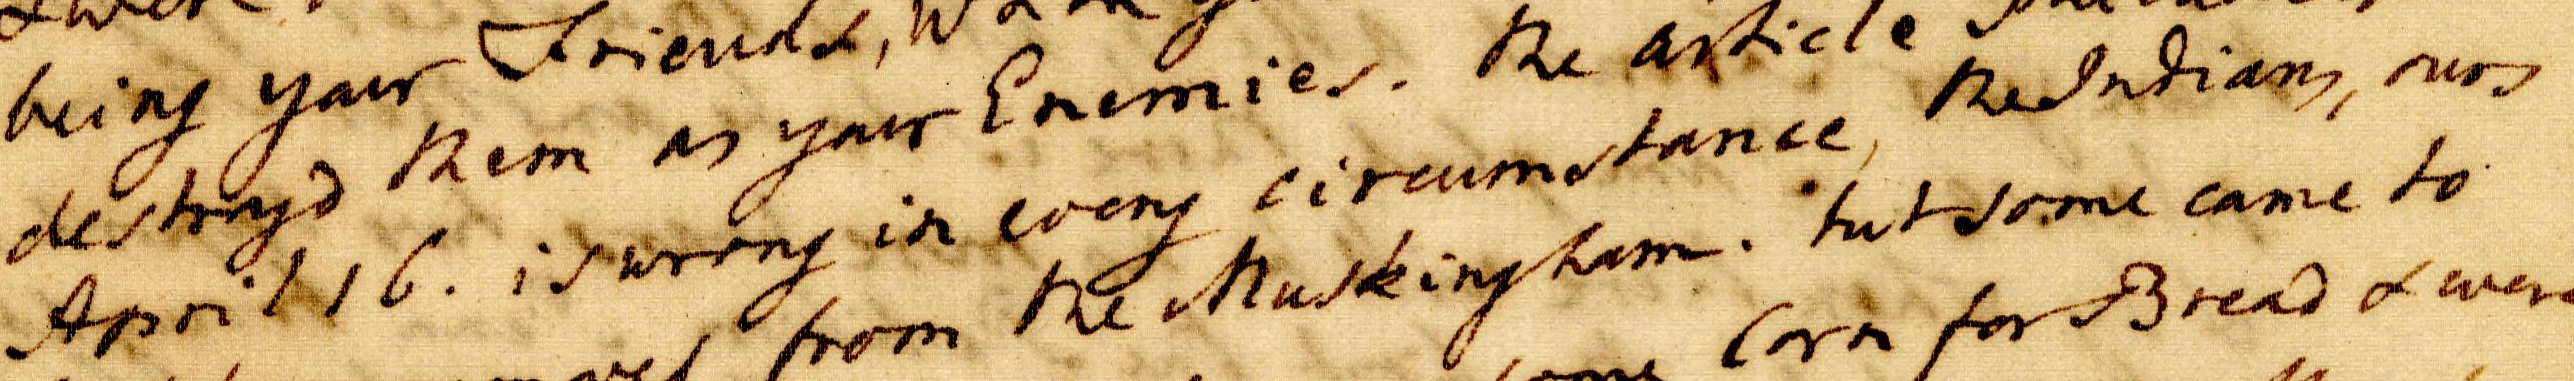April 16. is wrong in every circumstance, the Indians, ours
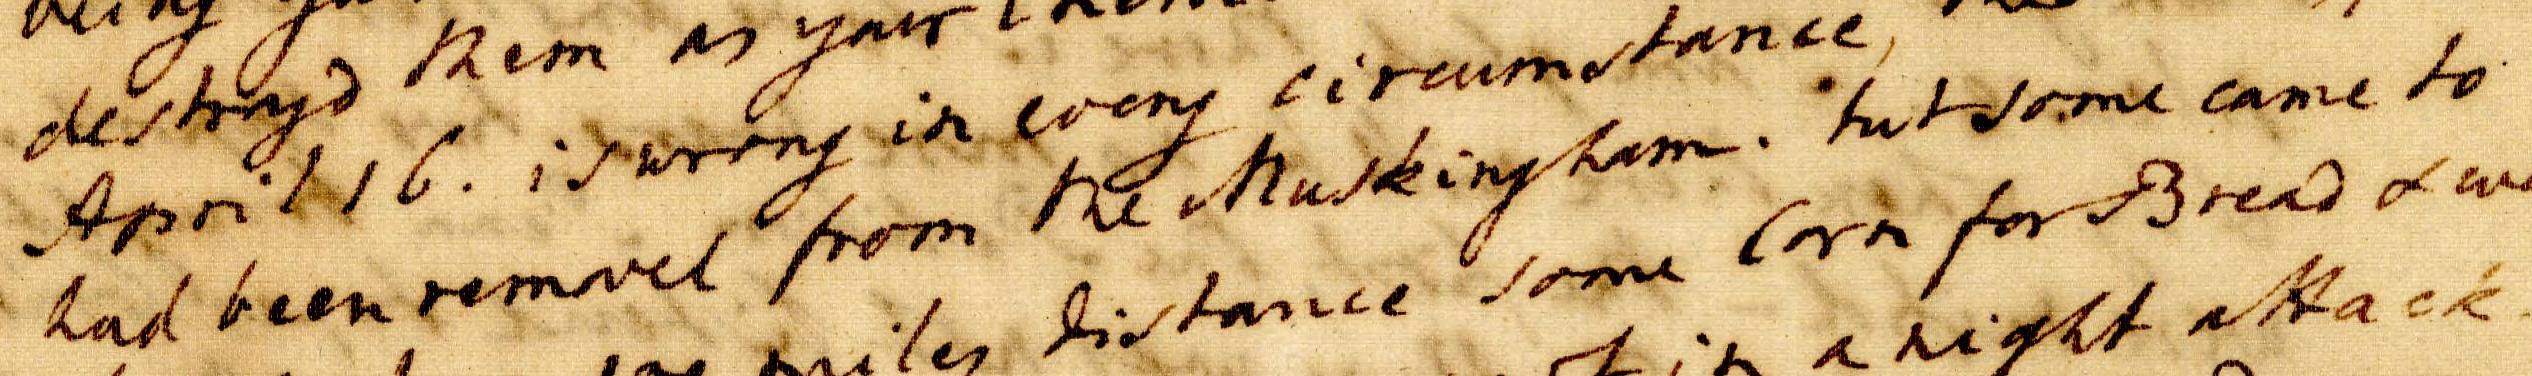had been removed from the Muskingham. but some came to
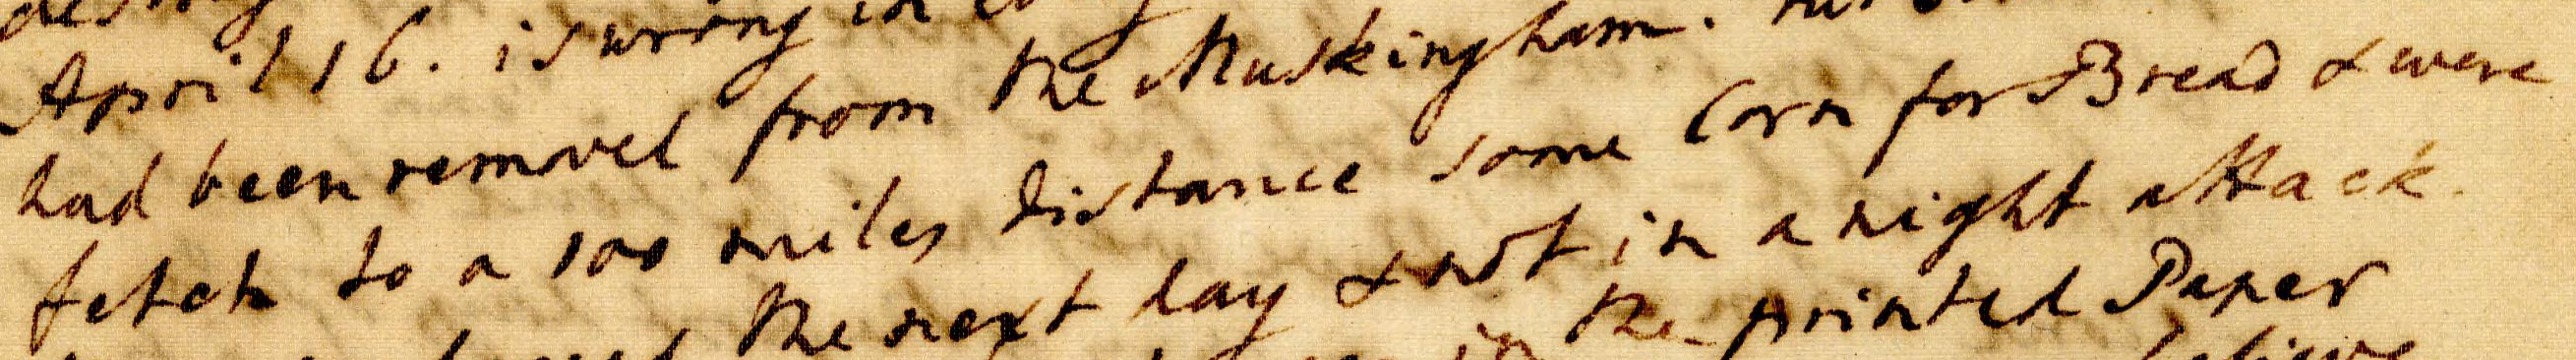fetch to a 100 miles distance some Corn for Bread & were
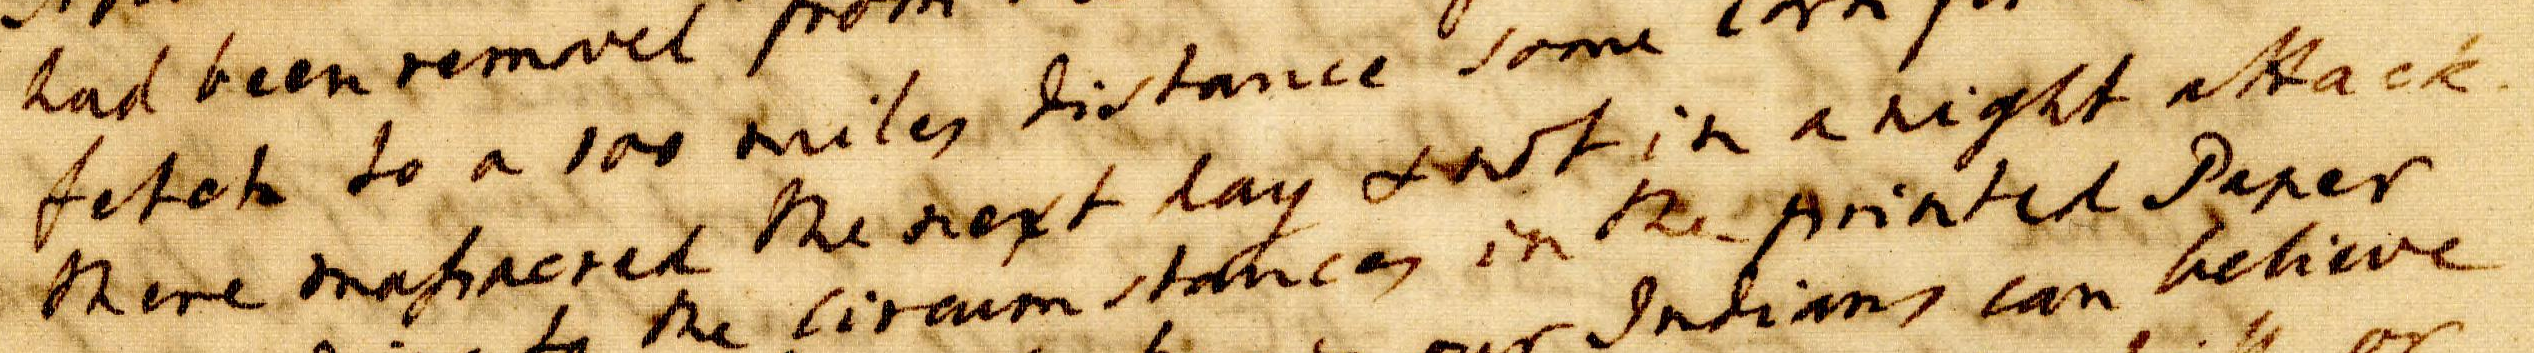there massacred the next day & not in a night attack
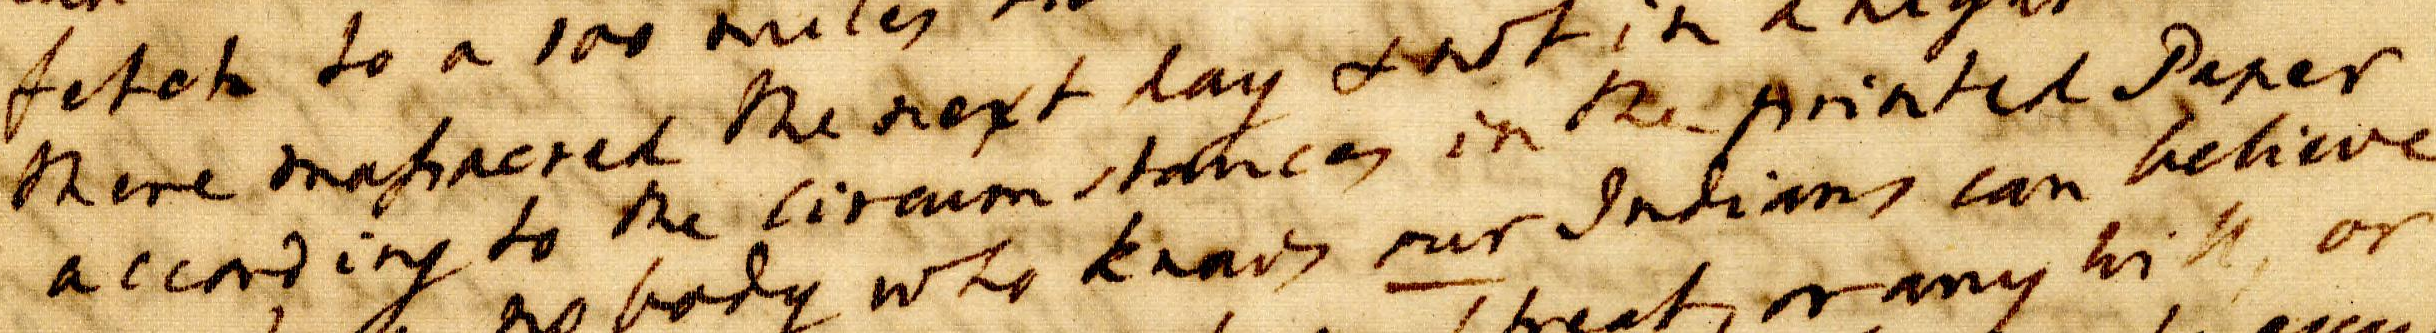according to the Circumstances in the printed Paper
